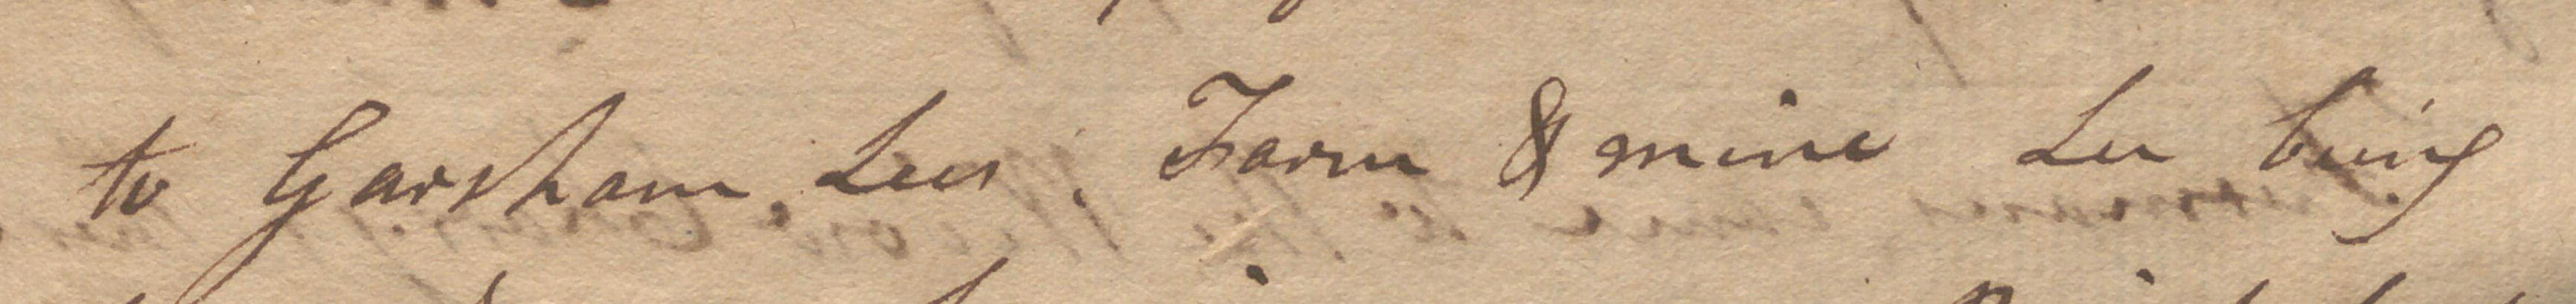to Garsham Lees Farm & mine Lee being
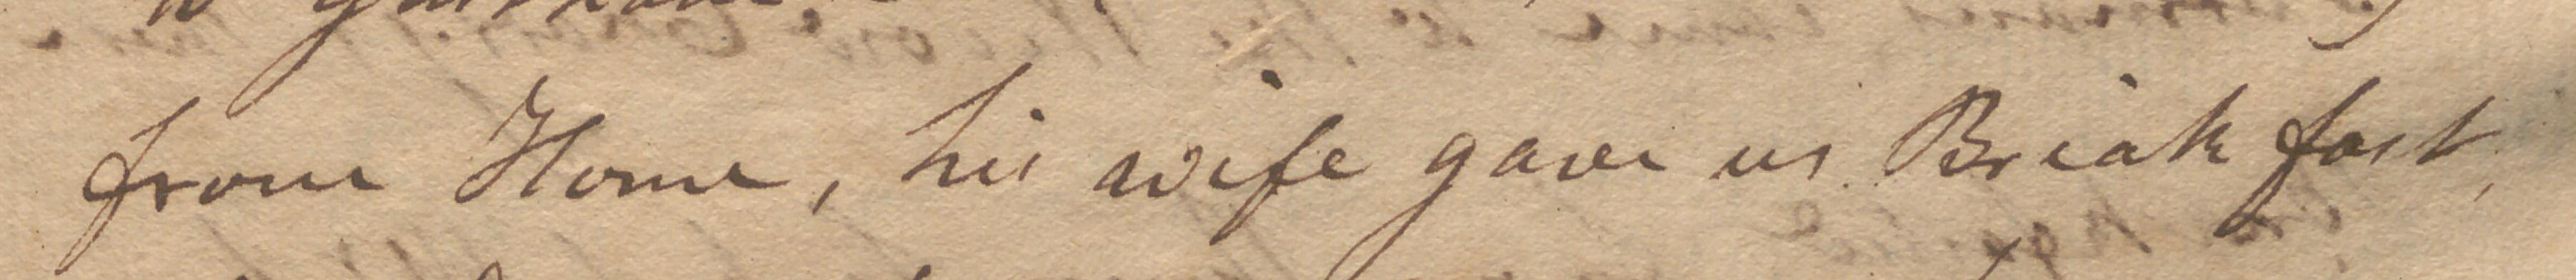froue Home, his wife gave us Breakfast
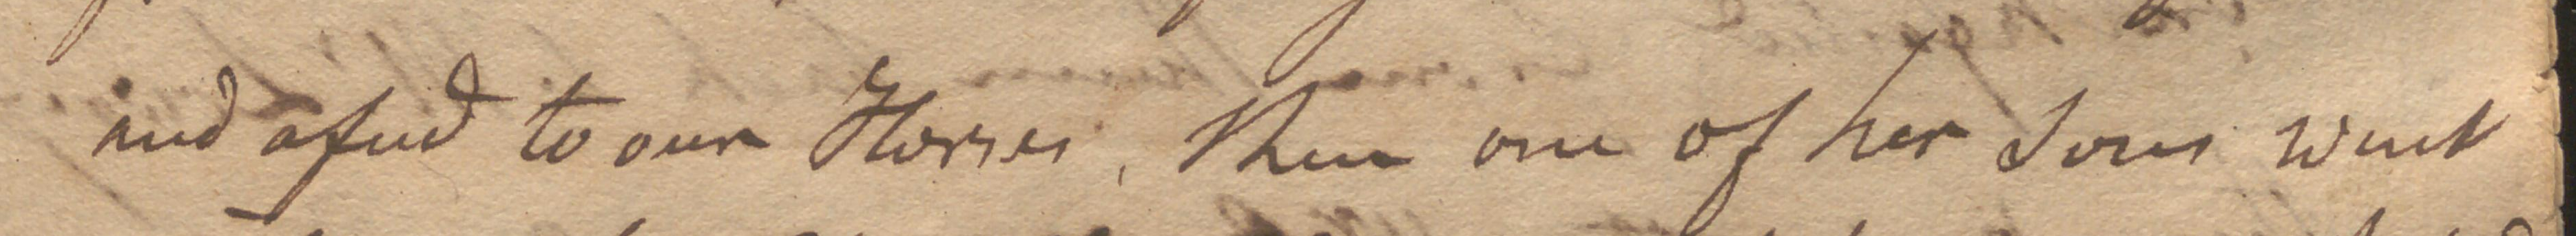and a feed to our Horses, there one of her sons went
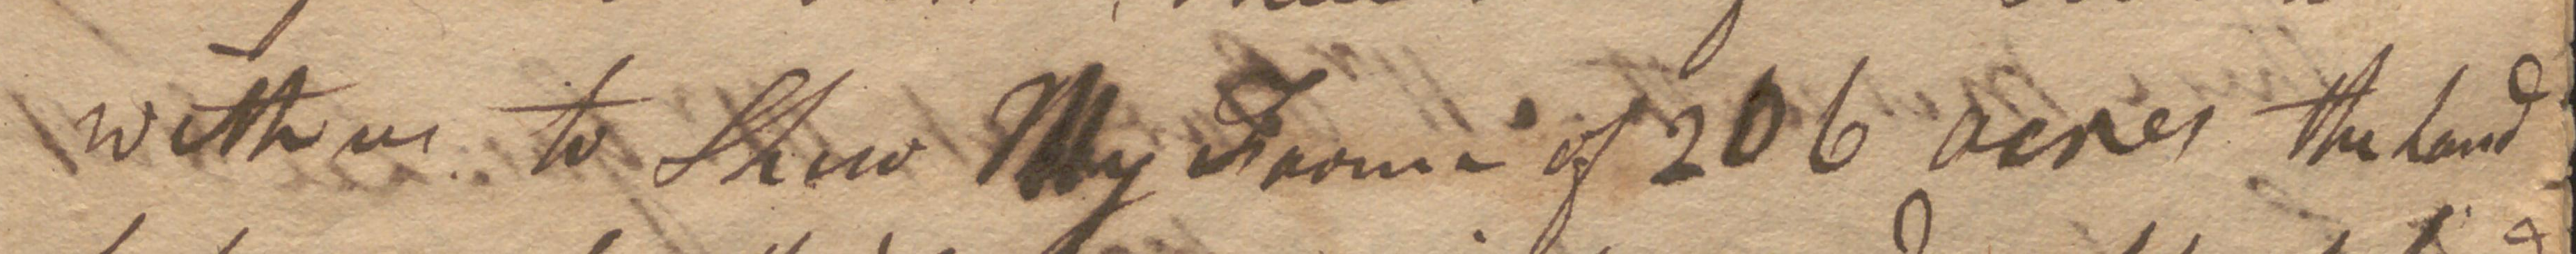with us to Shew My Farm of 206 acres the Land
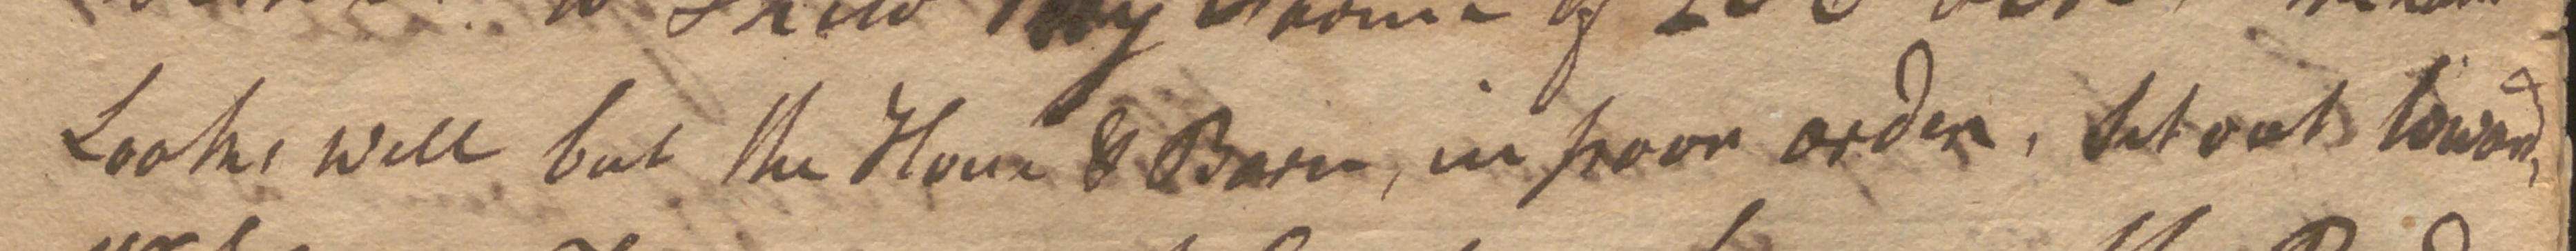Looks well, but the Hous & Barn in poor order. set out toward
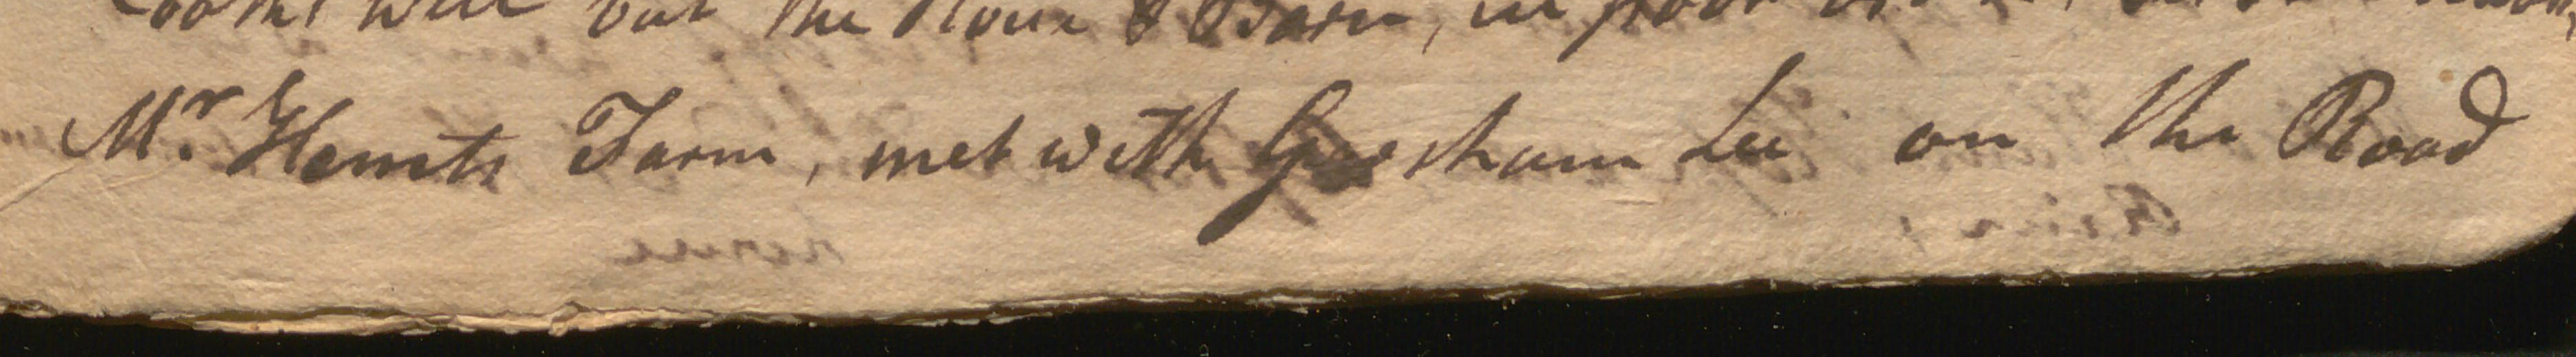M^r Hunts Farm, met with Garsham Lee on the Road
